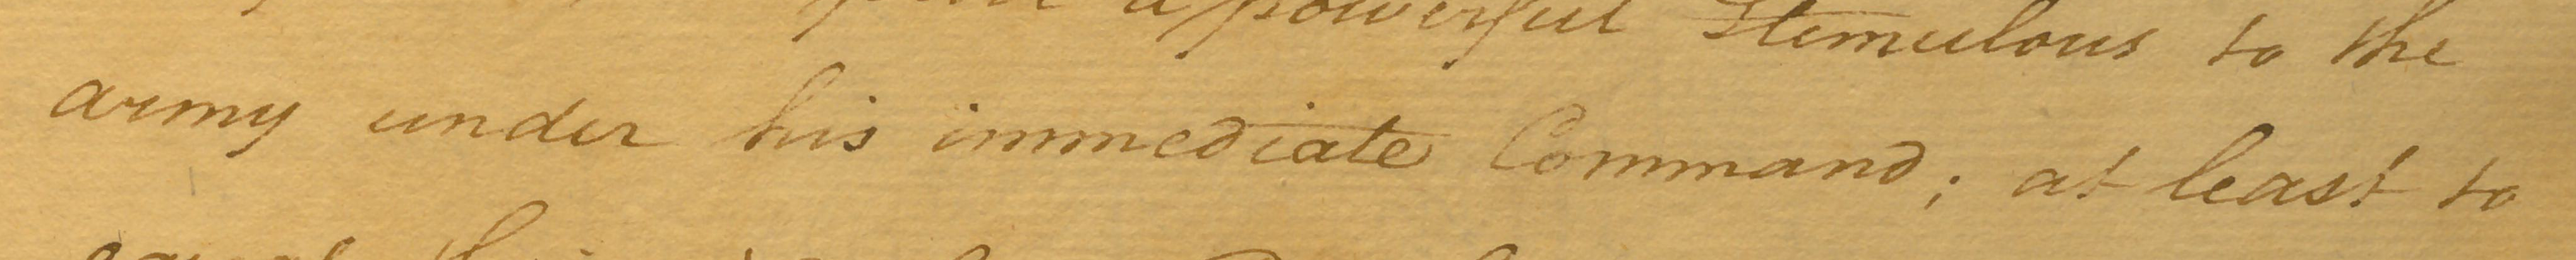army under his immediate Command; at least to
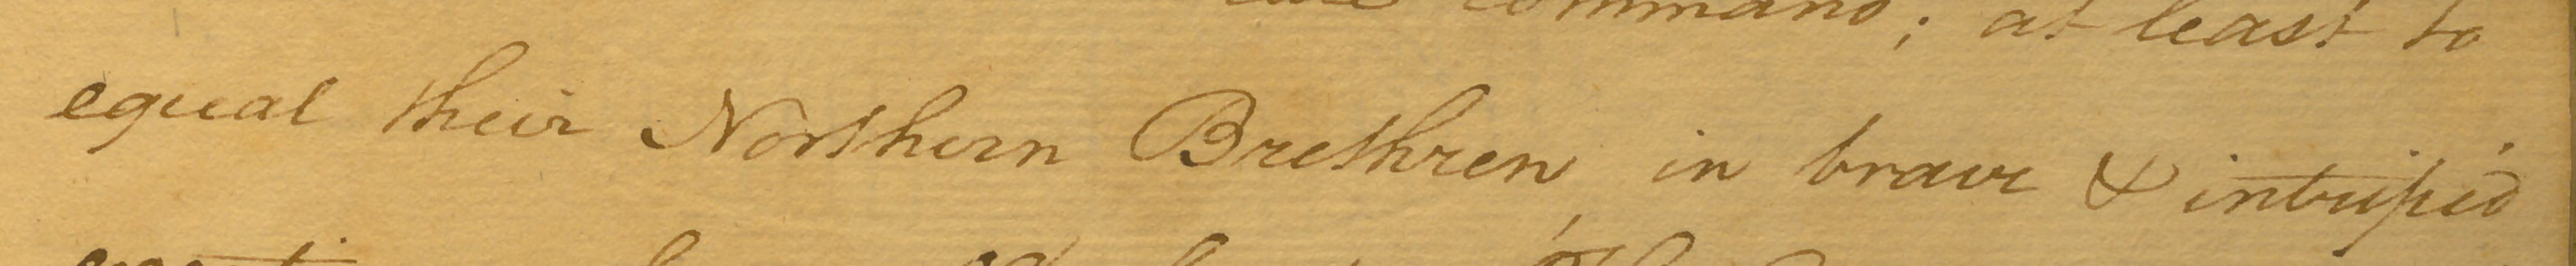equal their Northern Brethren in brave & intripid
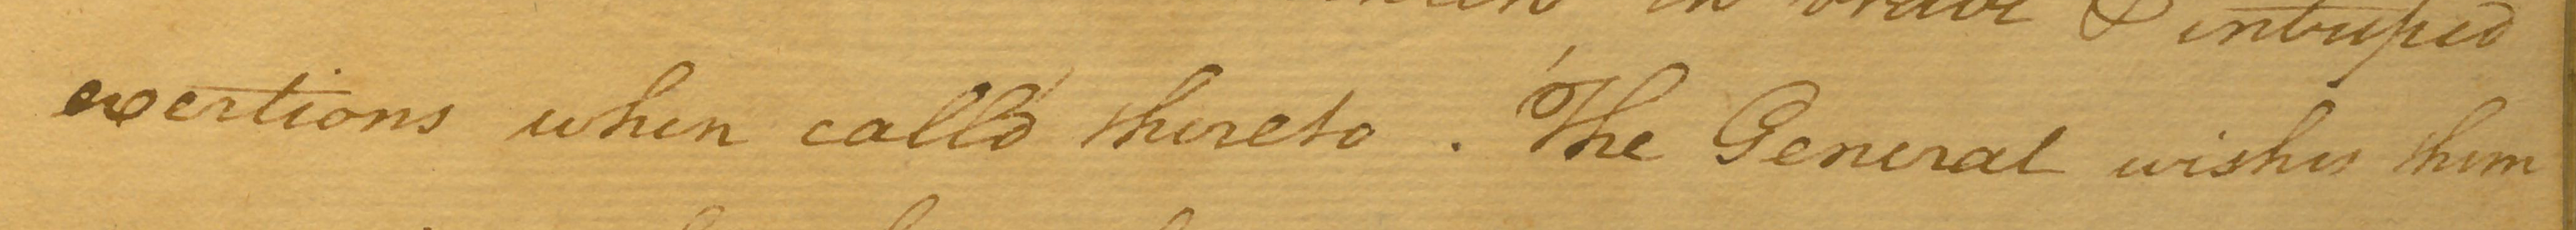exertions when call'd thereto. The General wishes him
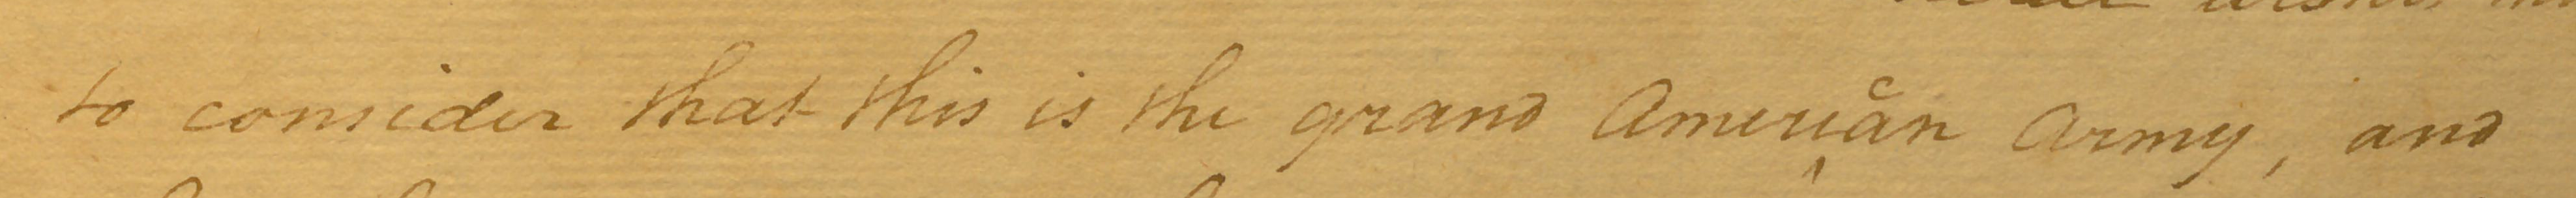to consider that this is hte grand Ameri^can Army, and
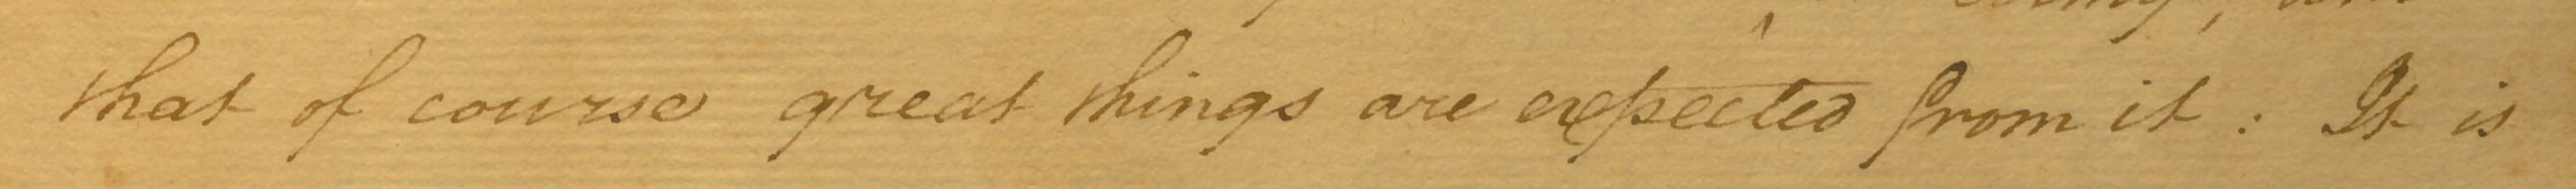that of course great things are expected from it: It is
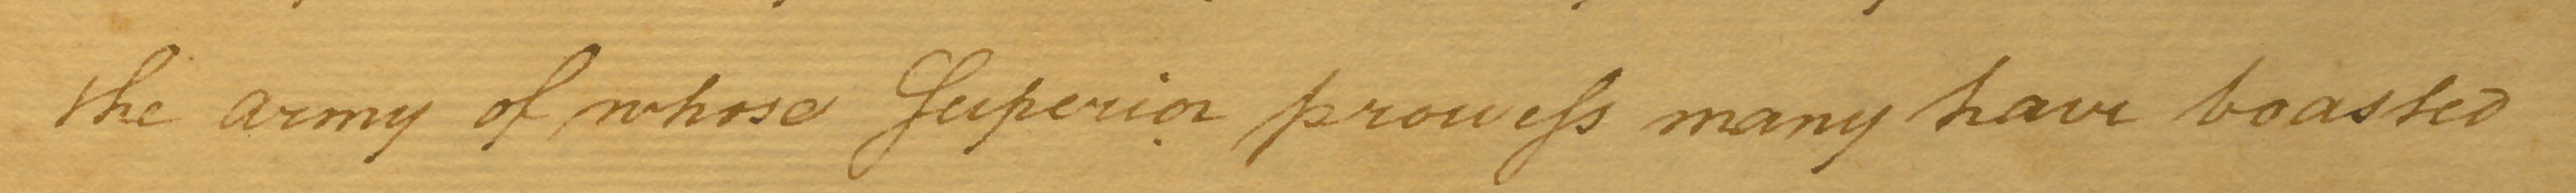the army of whose Superior prowess many have boasted
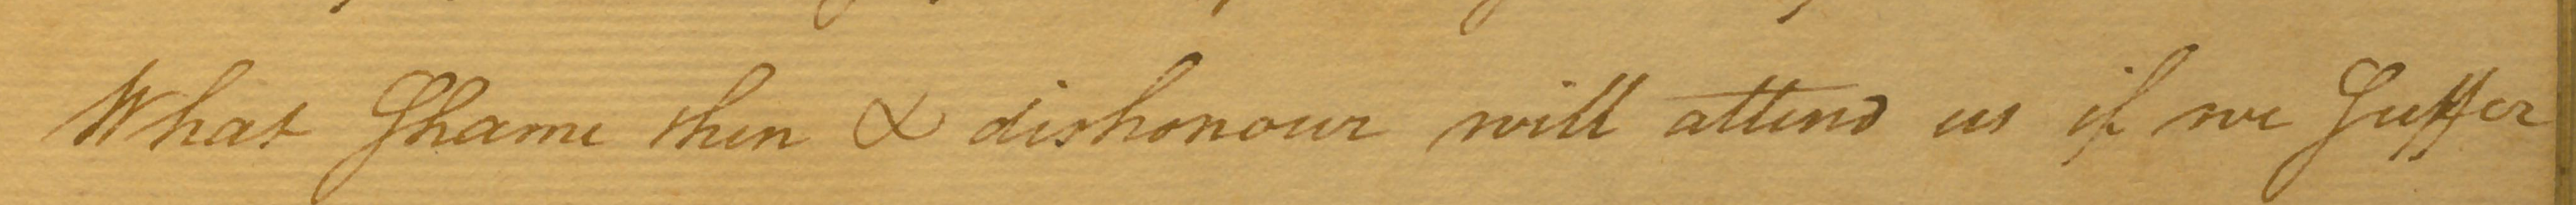What Shame then & dishonour will attend us if we Suffer
